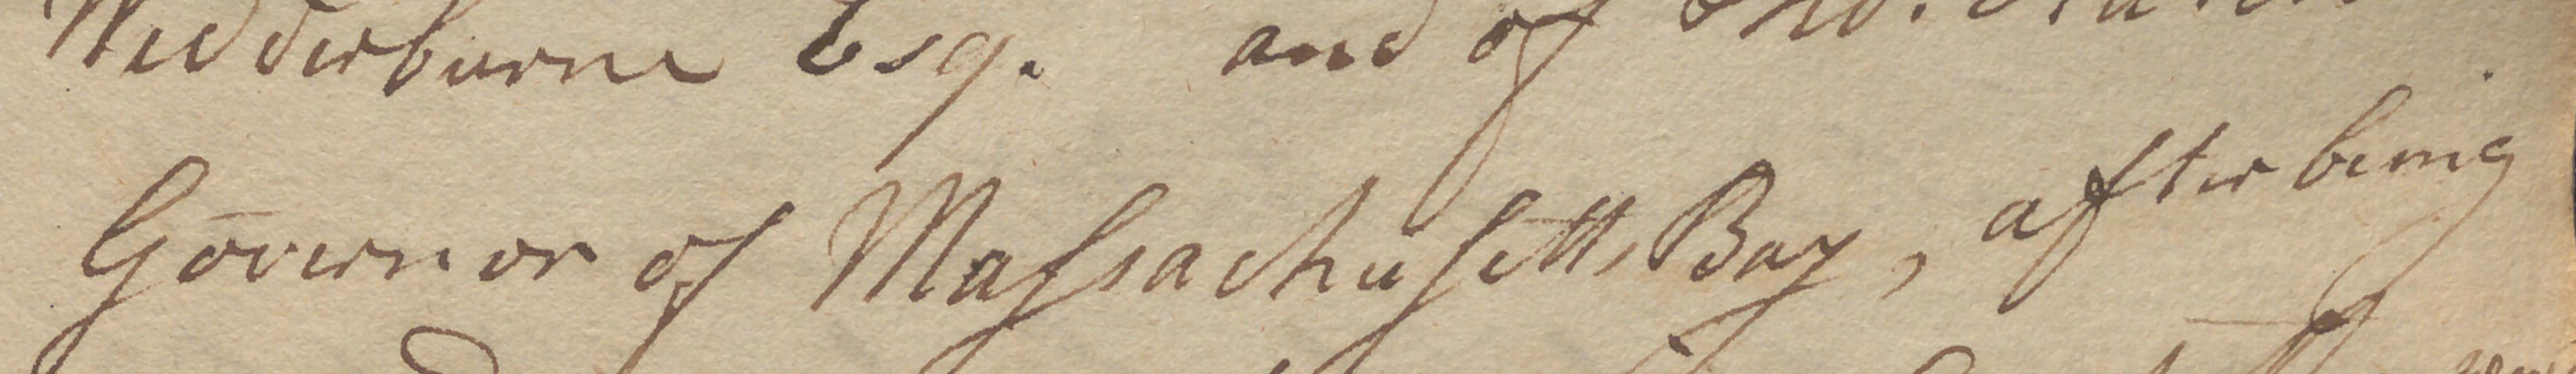Governor of Massachusetts Bay, after being
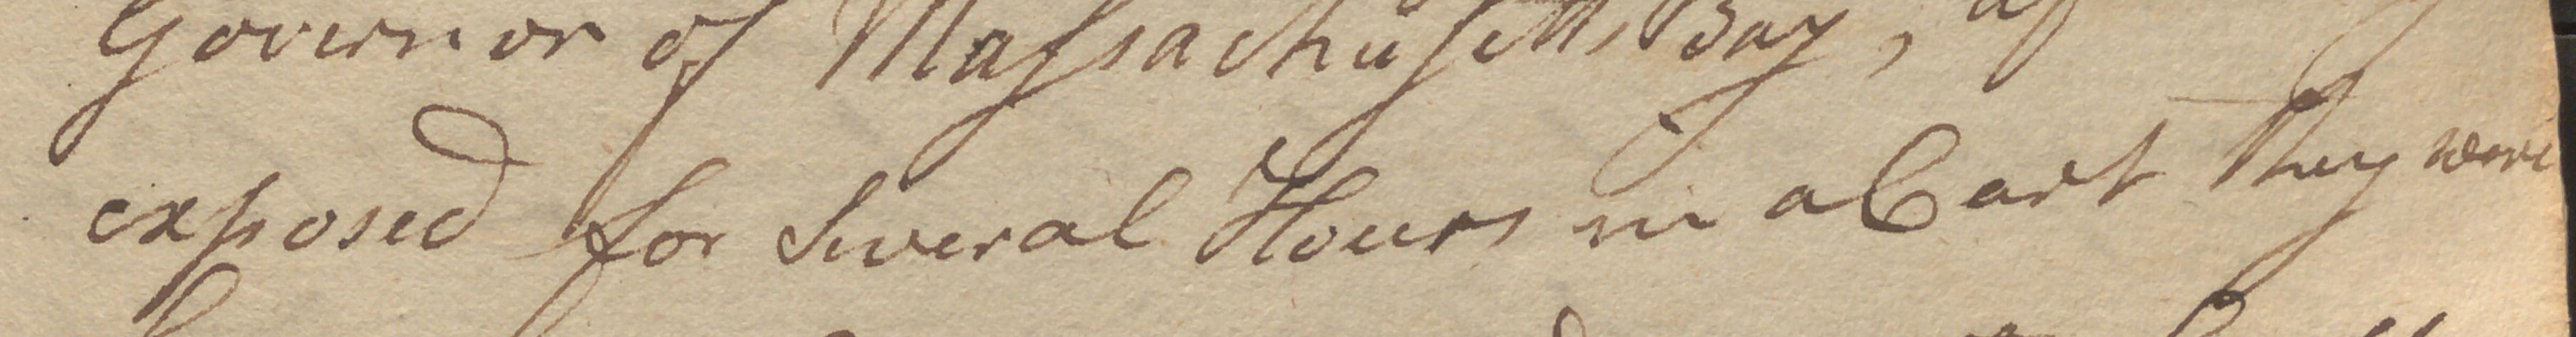exposed for Several Hours in a Cart they were
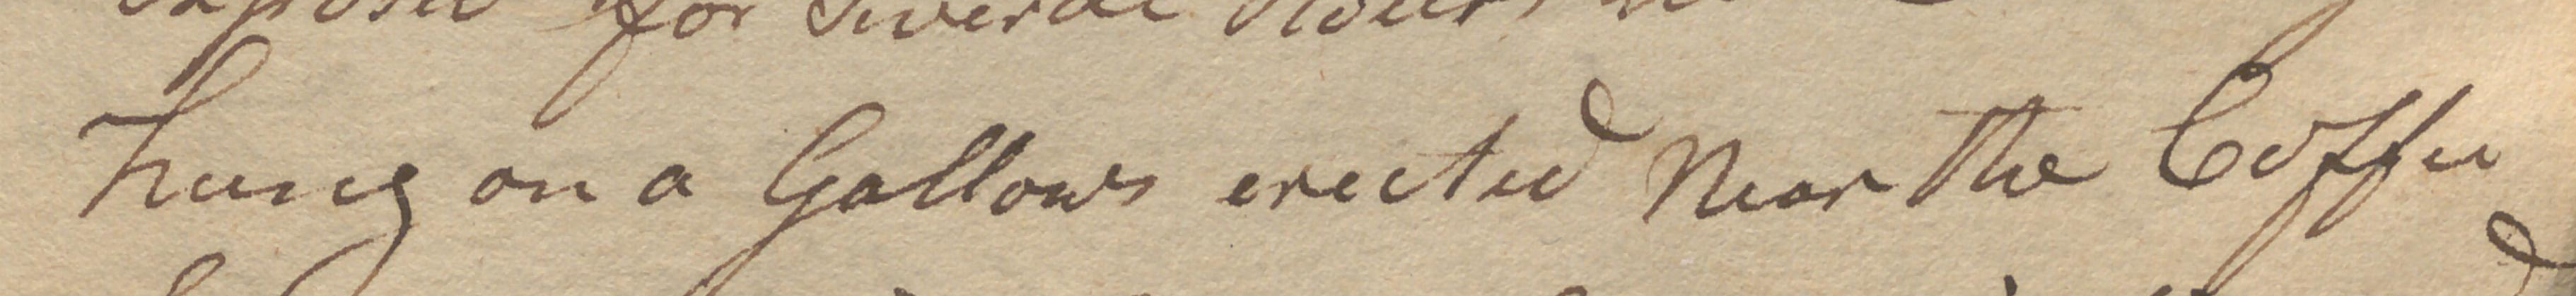hung on a Gallows erected Near the Coffer
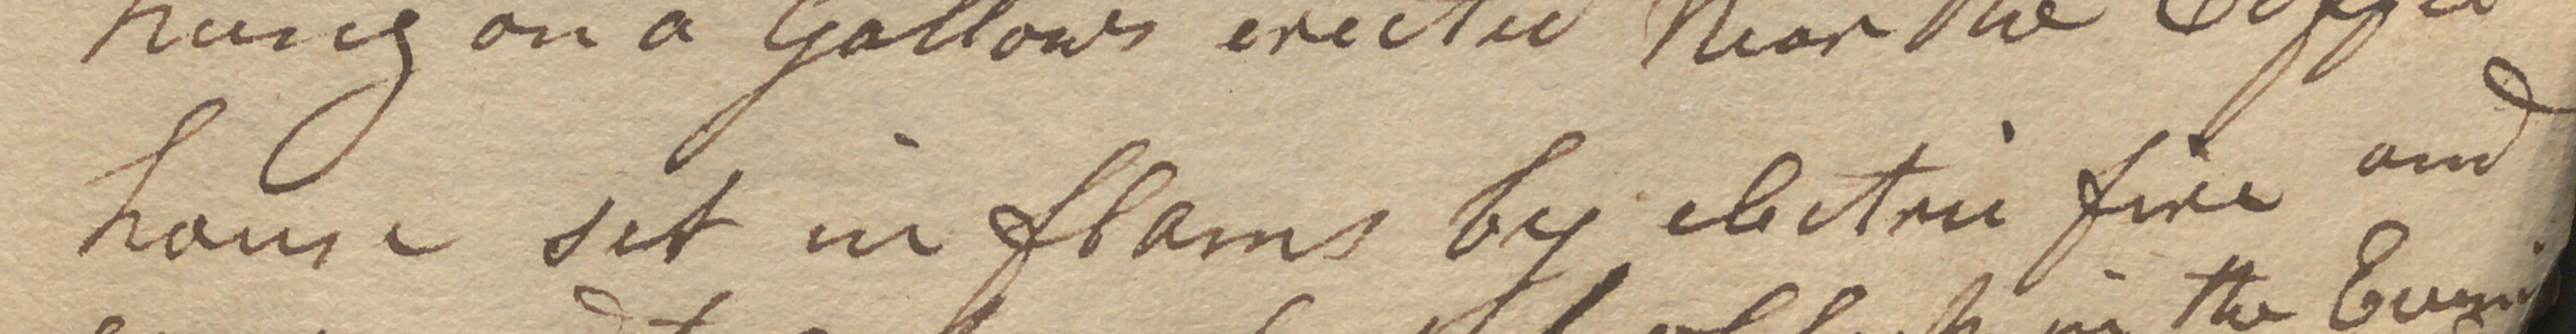house set in flams by electric fire an
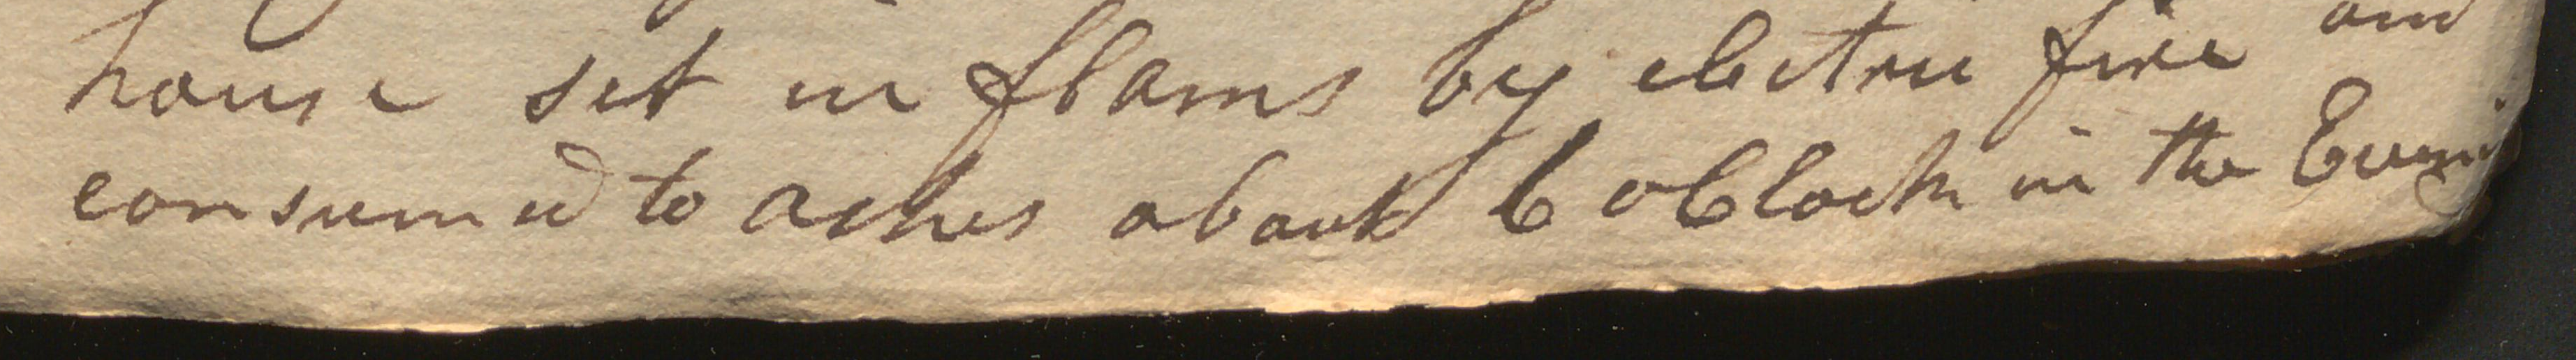consumed to ashes about 6 oClock in the Evening
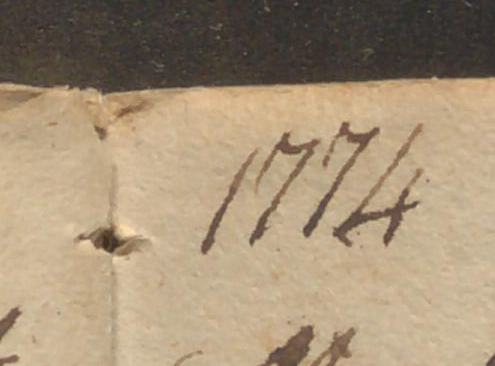1774
